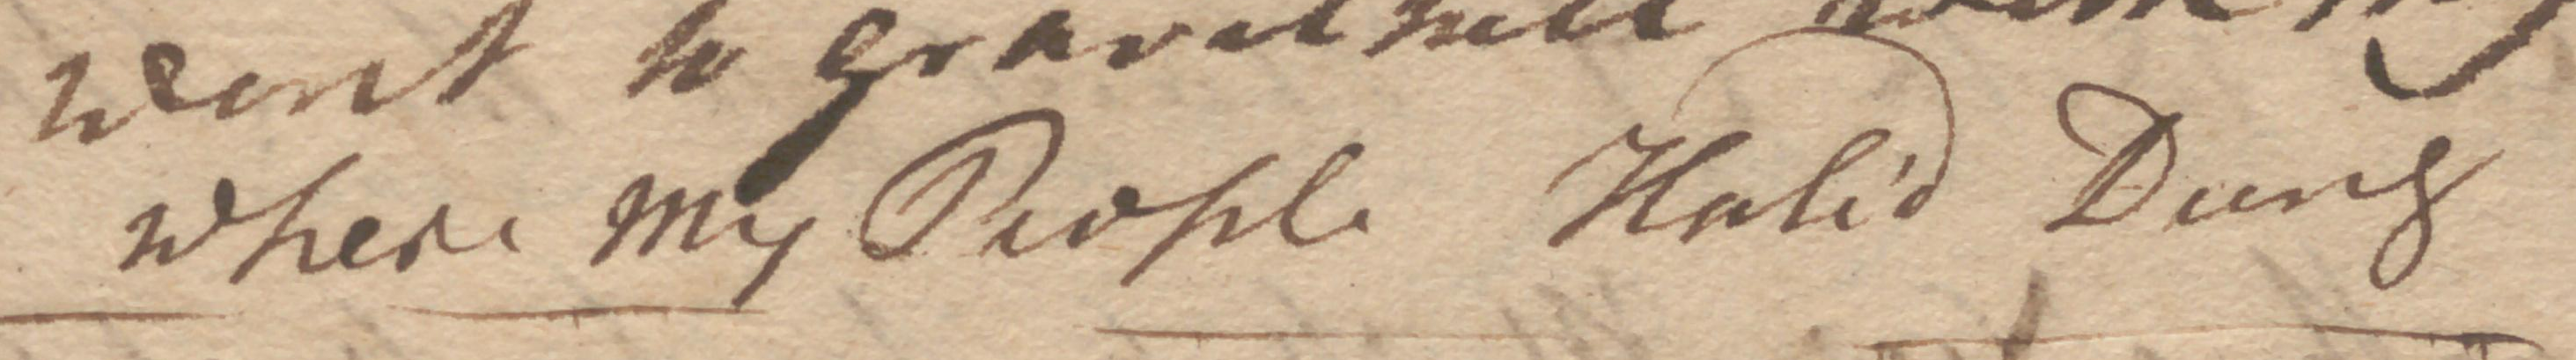where my People Haled Deng
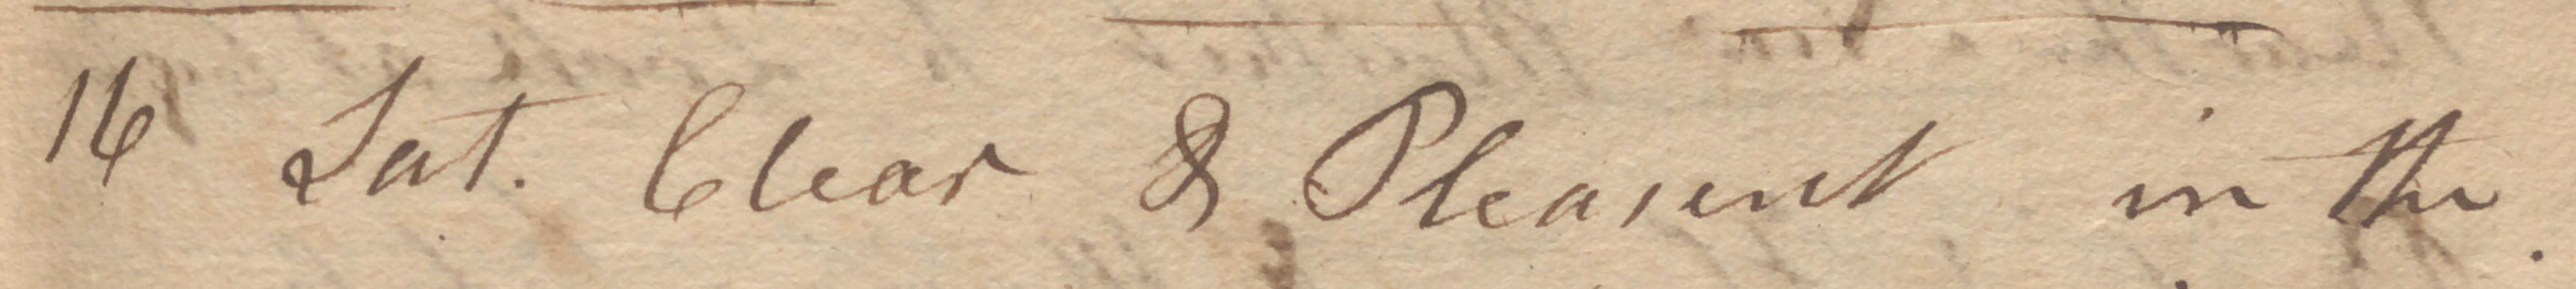16 Sat. Clear & Pleasent in the
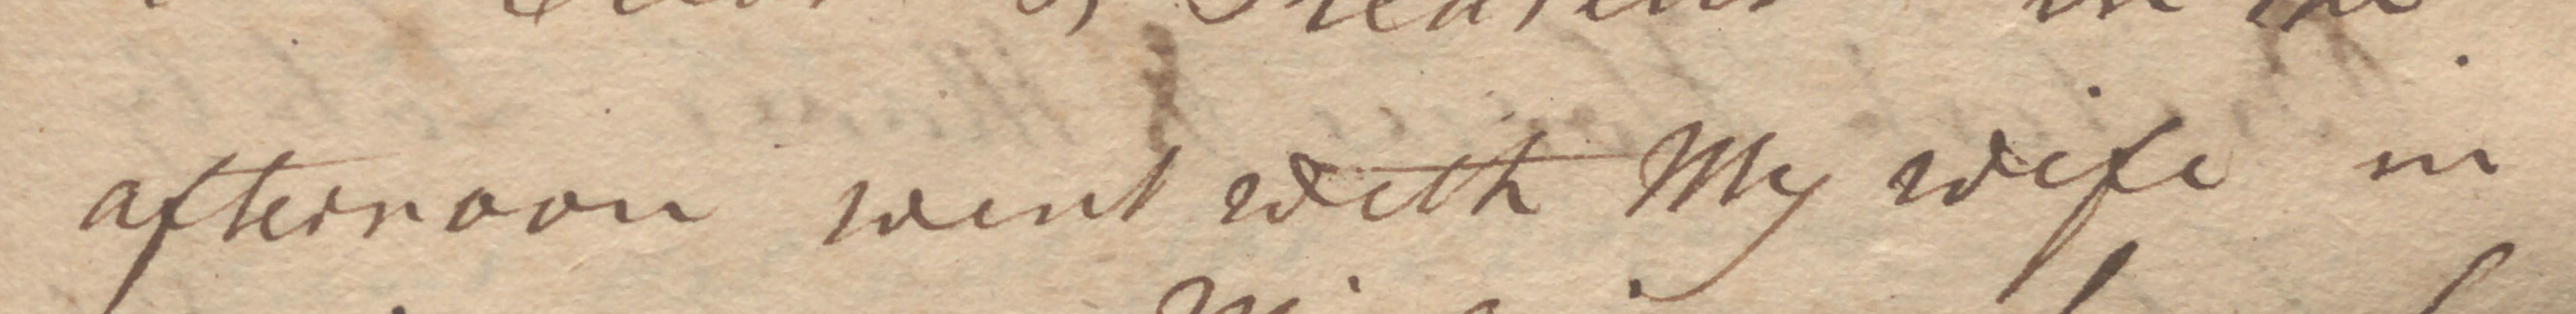afternoon went with My wife in
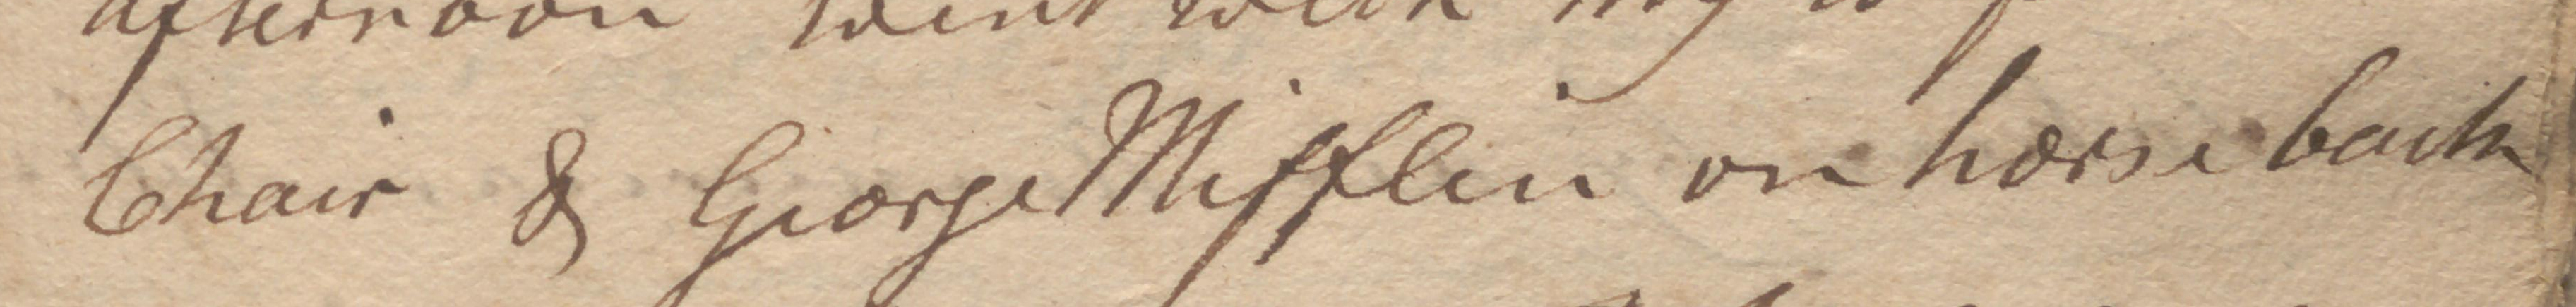Chair & George Mifflin on horseback
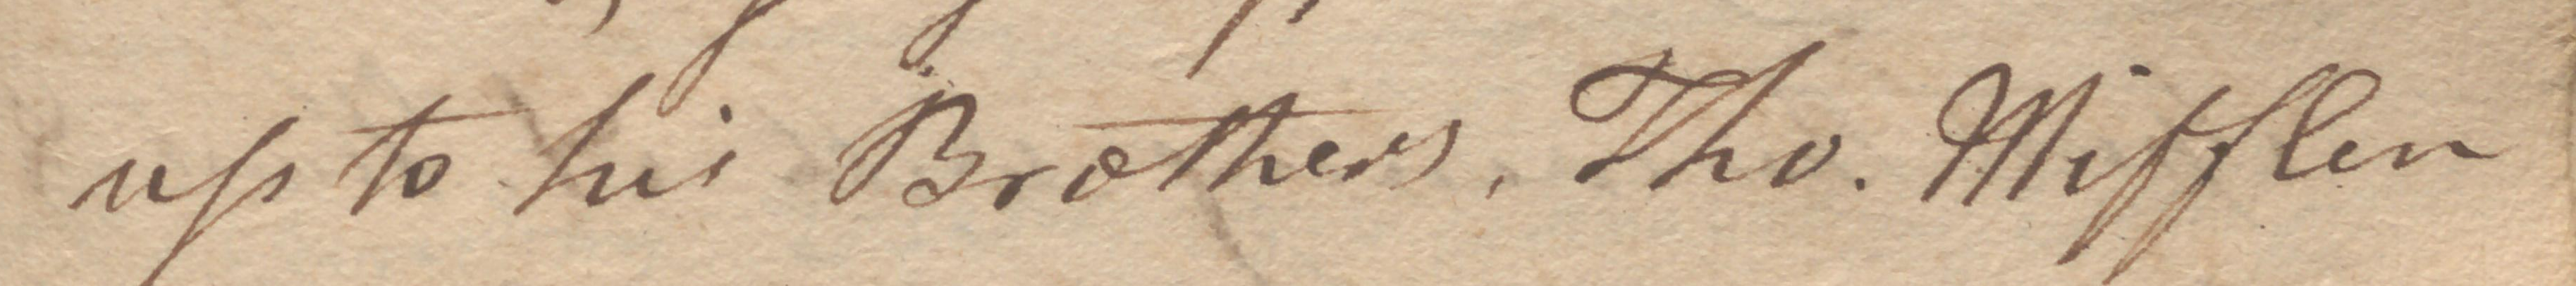up to his Brothers, Tho. Mifflin
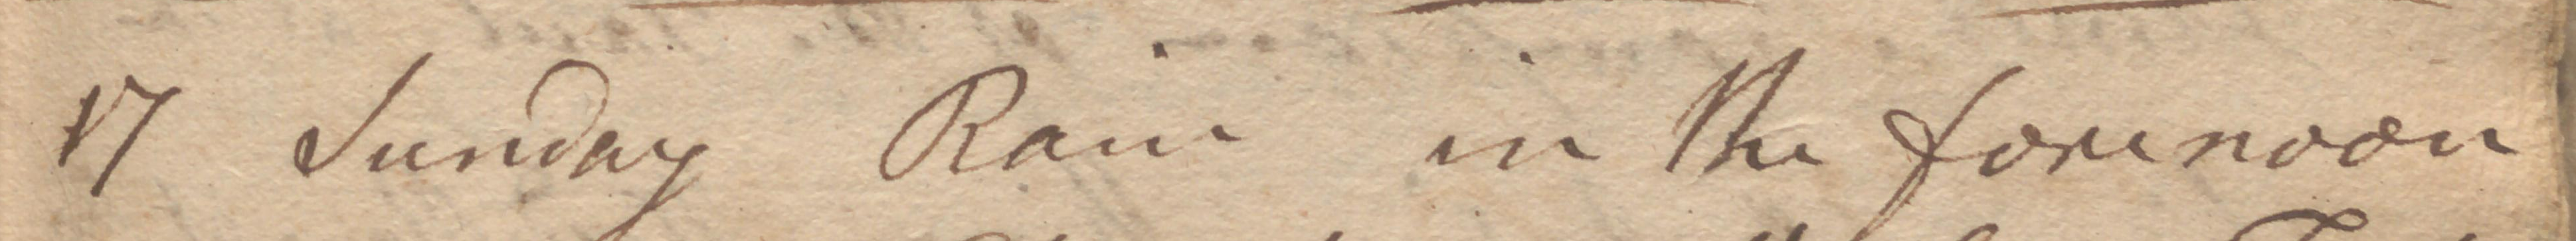17 Sunday Rain in the forenoon
